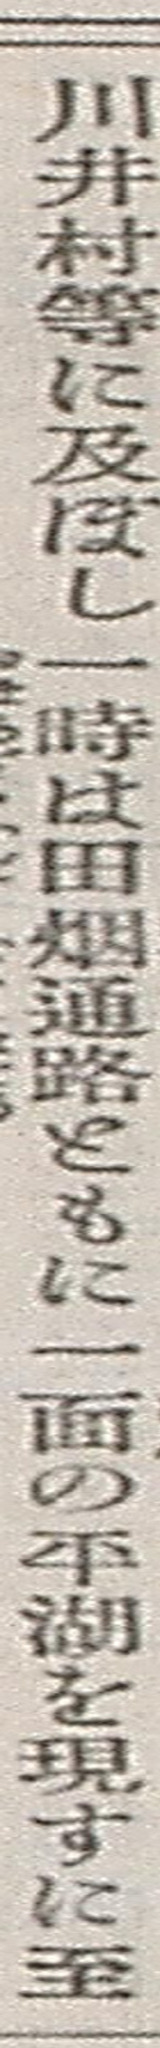川井村等に及ぼし一時は田畑通路ともに一面の平湖を現すに至
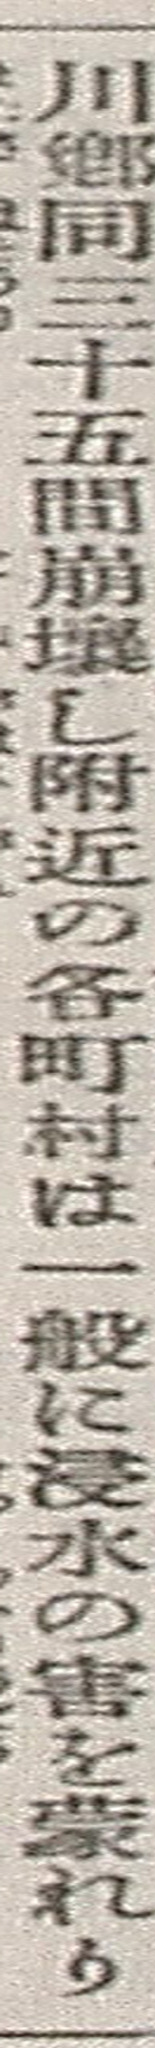川郷同三十五間崩壊し附近の各町村は一般に浸水の害を蒙れり
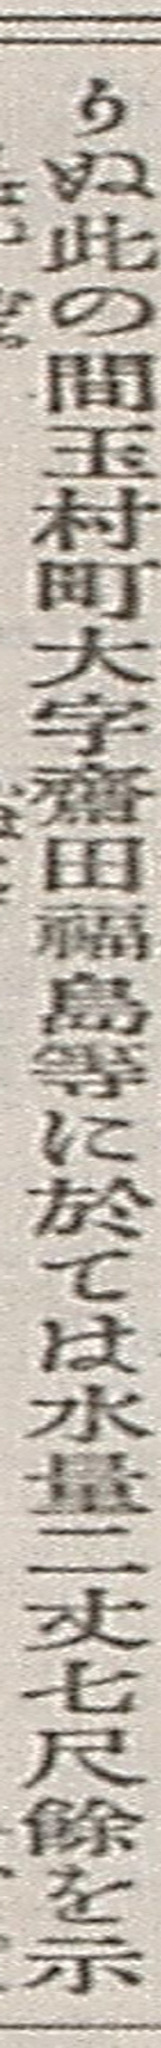りぬ此の間玉村町大字斉田福島等に於ては水量二丈七尺餘を示
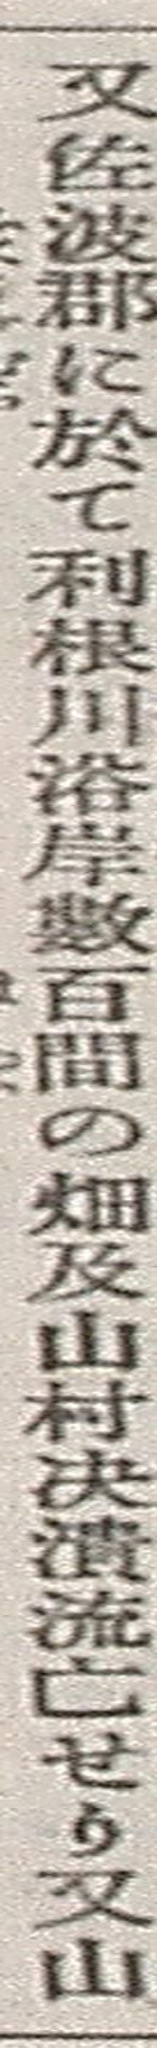又佐波郡に於て利根川沿岸数百間の畑及山村决潰流亡せり又山
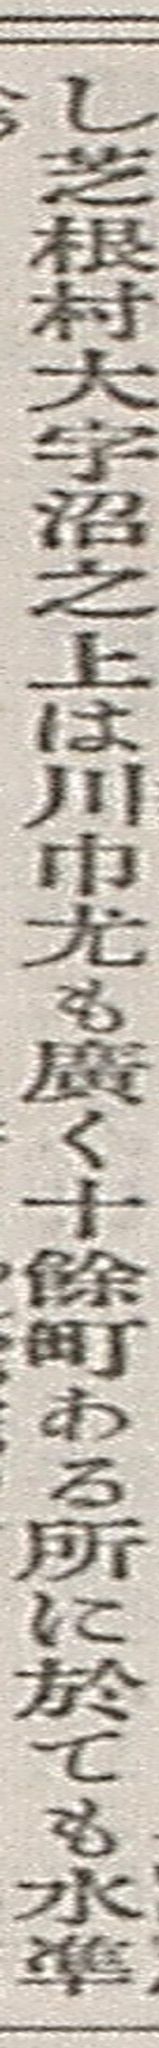し芝根村大字沼之上は川巾尤も広く十餘町ある所に於ても水準
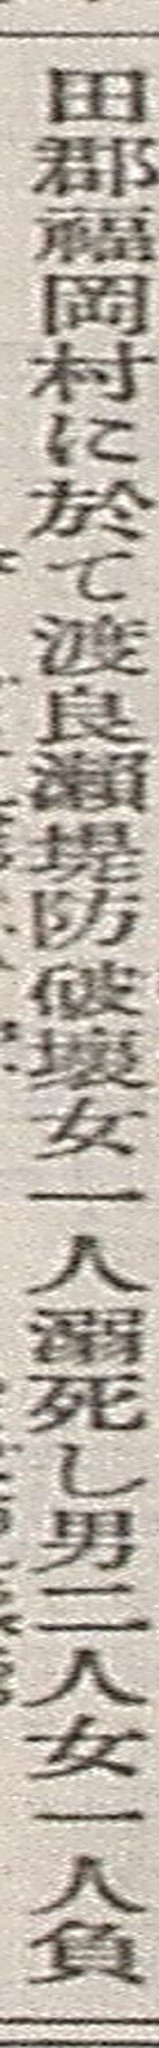田郡福岡村に於て渡良瀬堤防破壊女一人溺死し男二人女一人負
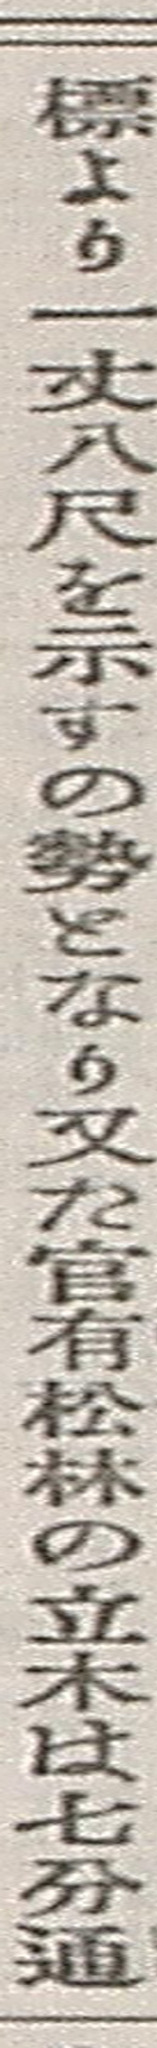標より一丈八尺を示すの勢となり又た官有松林の立木は七分通
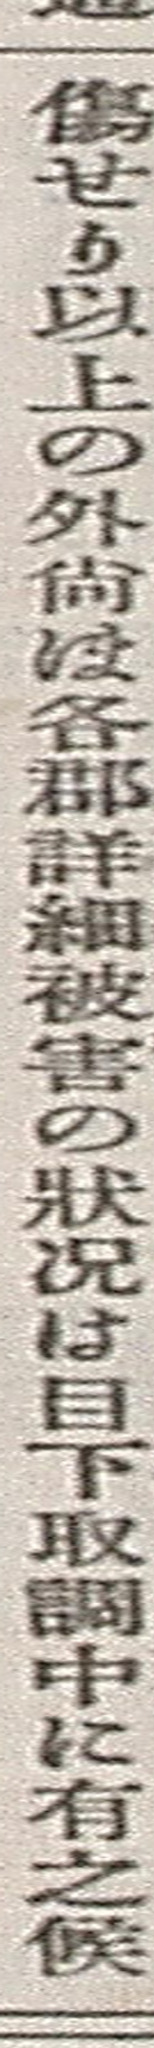傷せり以上の外尚ほ各郡詳細被害の状況は目下取調中に有之候
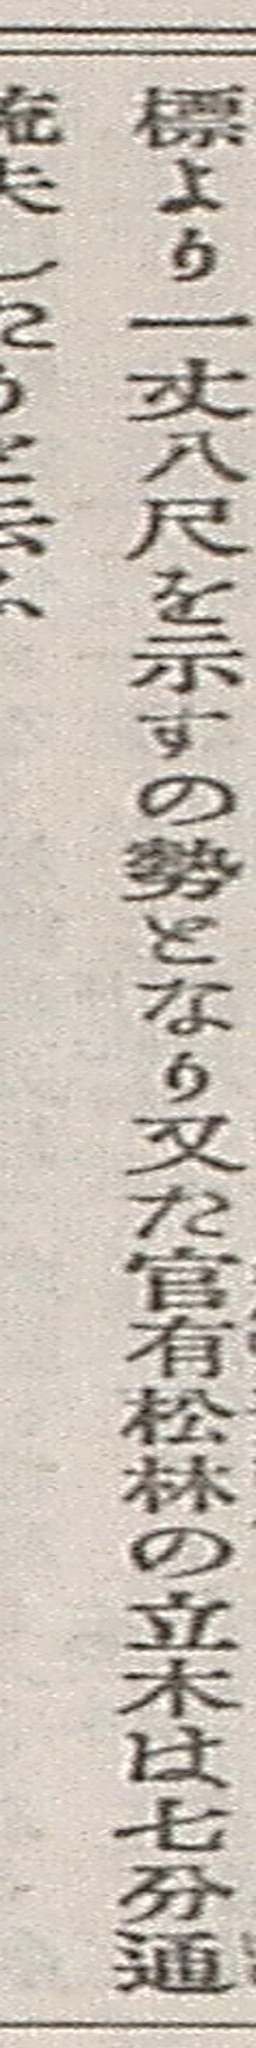標より一丈八尺を示すの勢となり又た官有松林の立木は七分通
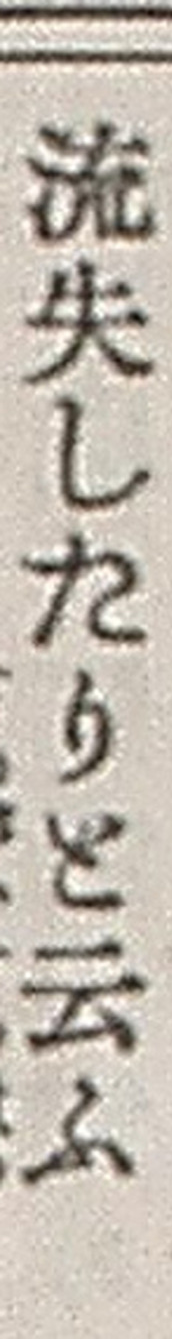流失したりと云ふ
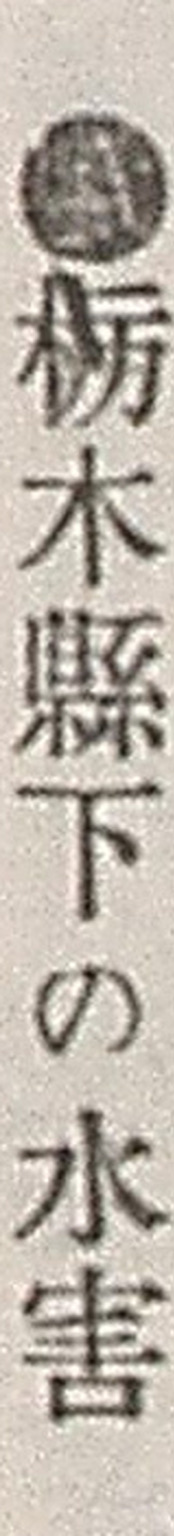●栃木県下の水害
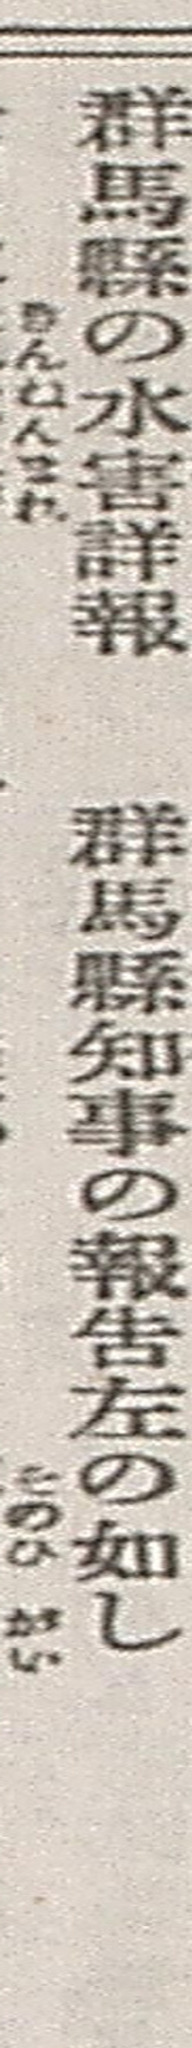群馬県の水害詳報群馬県知事の報告左の如し
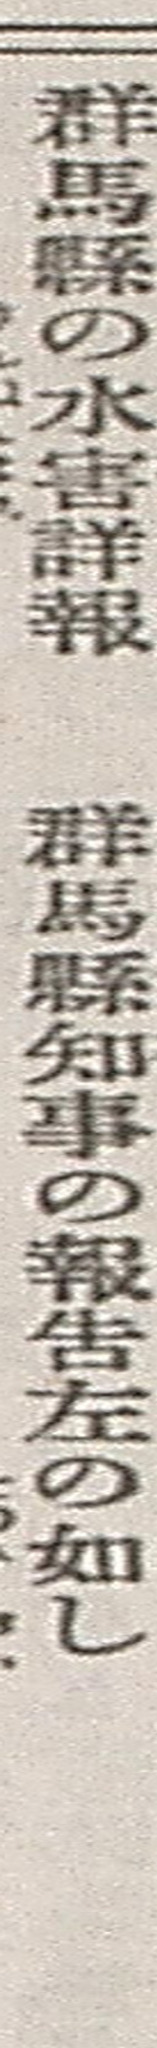群馬県の水害詳報群馬県知事の報告左の如し
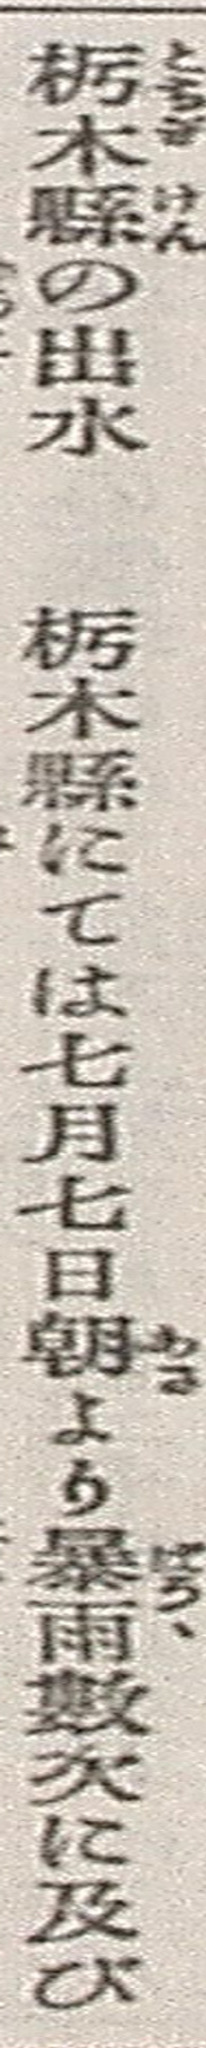栃木県の出水栃木県にては七月七日朝より暴雨数次に及び
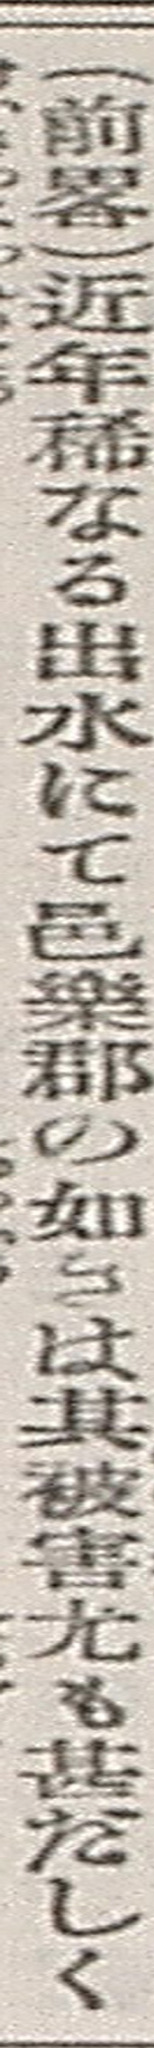近年稀なる出水にて邑楽郡の如きは其被害尤も甚だしく
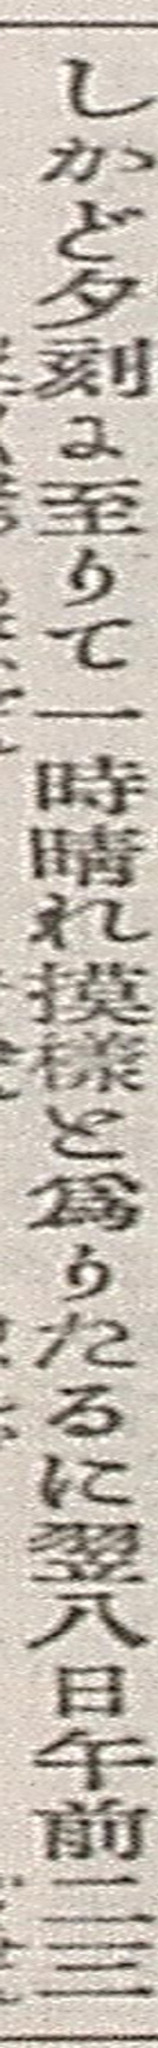しかど夕刻に至りて一時晴れ模様と為りたるに翌八日午前二三
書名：風俗畫報臨時増刊第百二十八號　洪水被害録（下）
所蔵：東京大学地震研究所図書室 Earthquake Research Institute Library, The University of Tokyo, JAPAN
